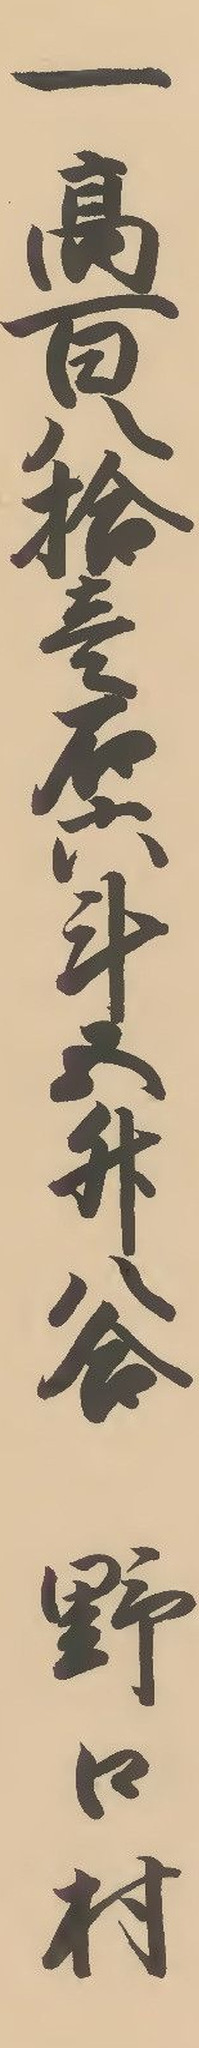一高百八拾壱石六斗五升八合野口村

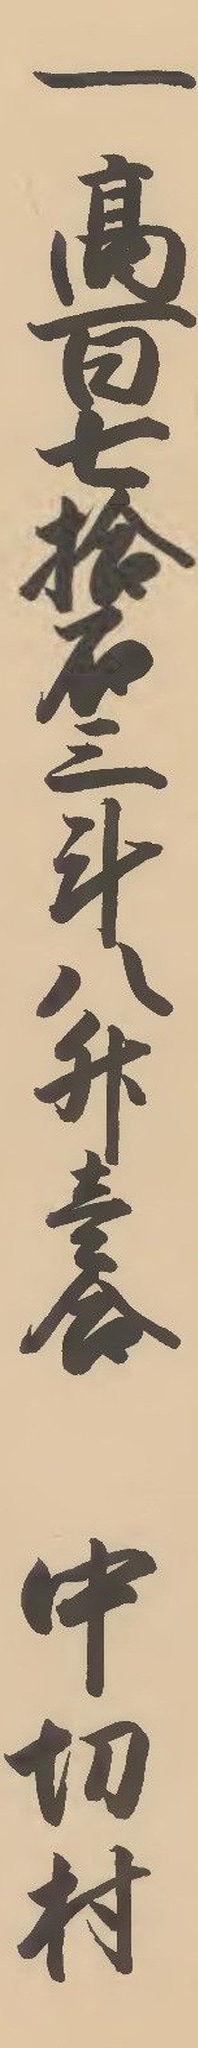一高百七拾石三斗八升壱合中切村
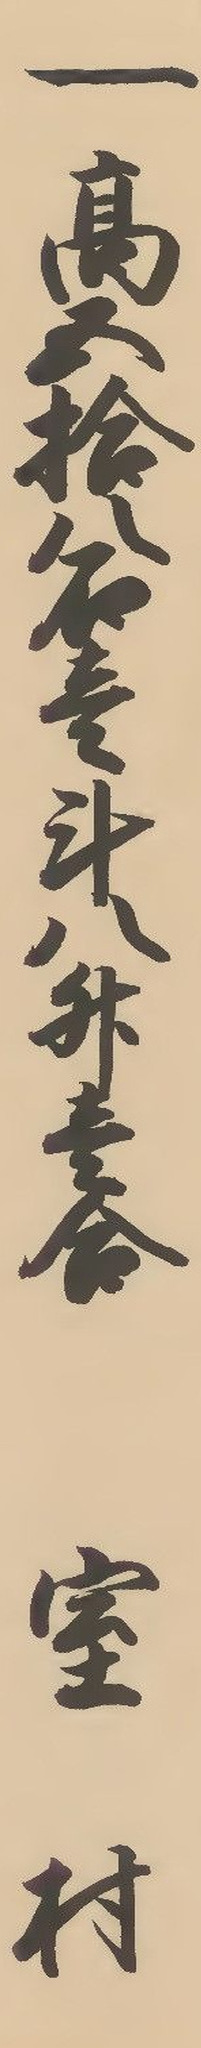一高五拾八石壱斗八升壱合室村
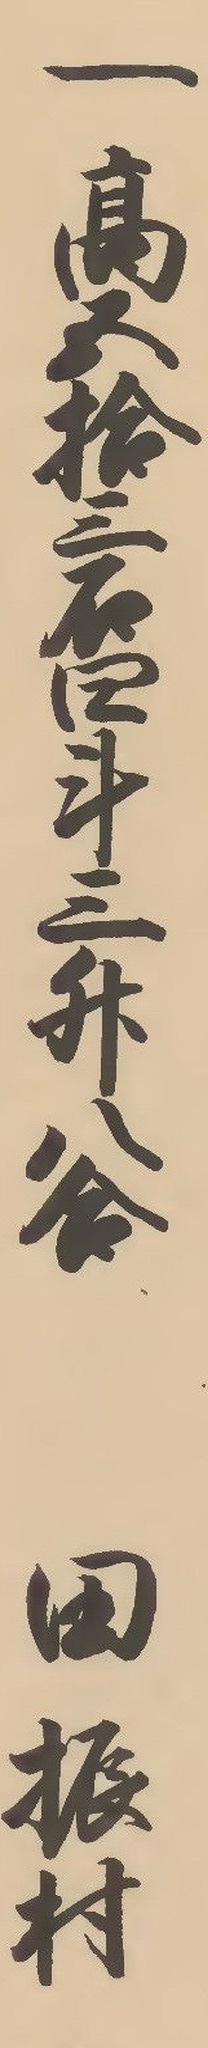一高五拾三石四斗三升八合田振村
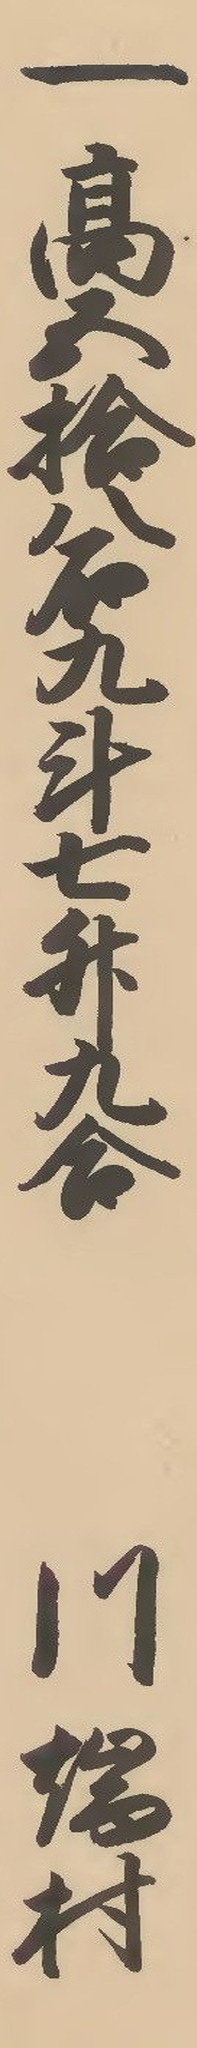一高五拾八石九斗七升九合川端村
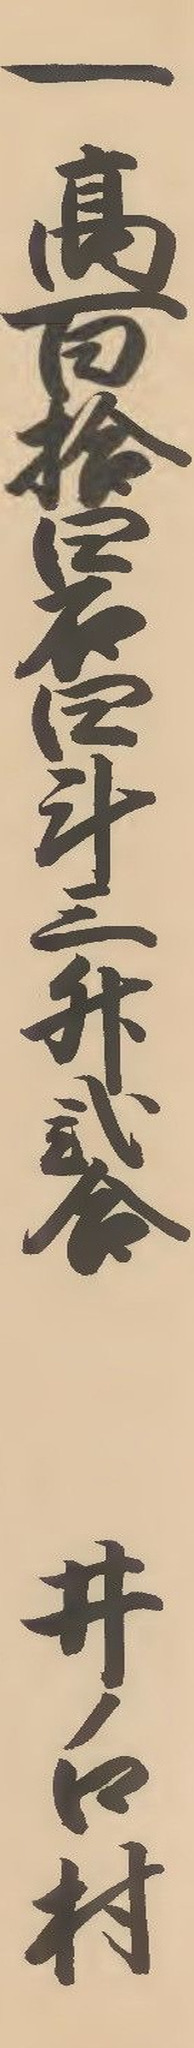一高百拾四石四斗三升弐合井ノ口村
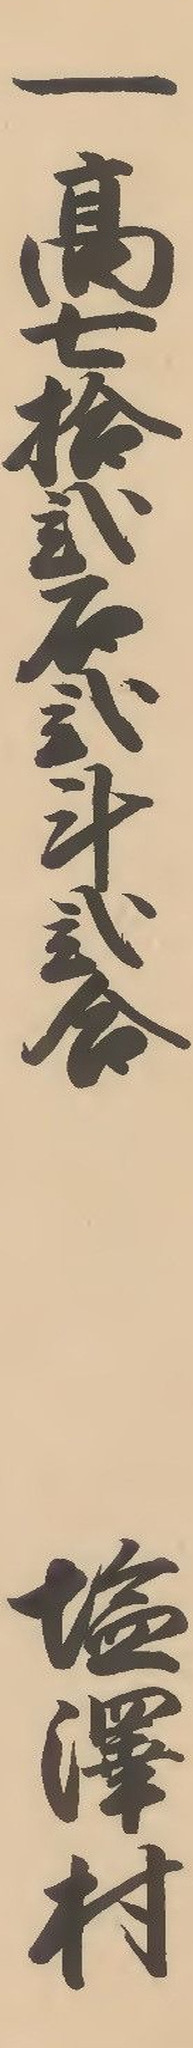一高七拾弐石弐斗弐合塩沢村
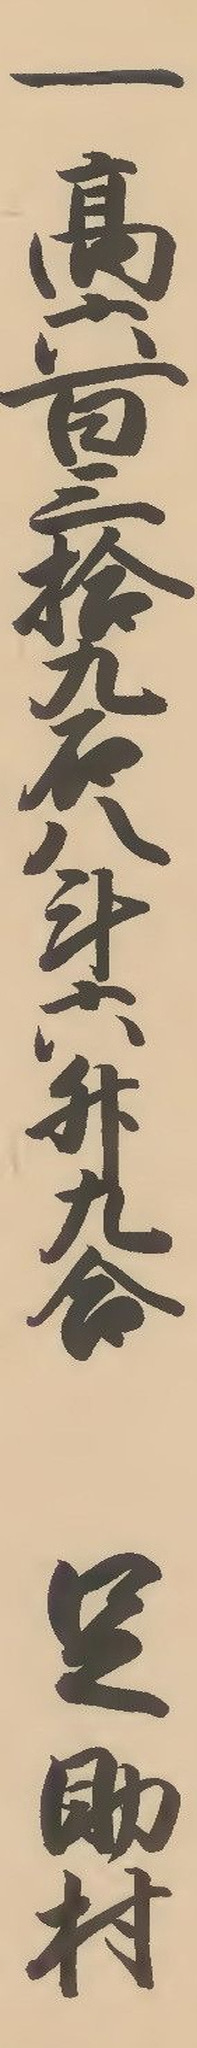一高六百三拾九石八斗六升九合足助村

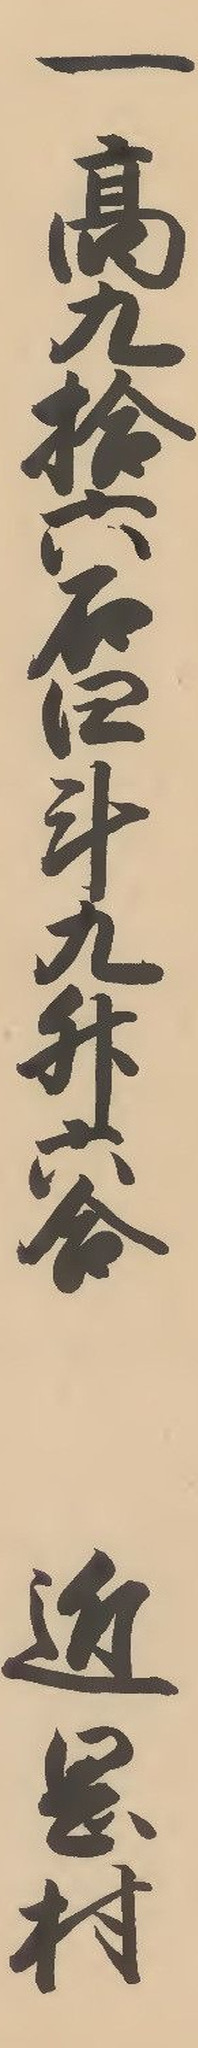一高九拾六石四斗九升六合近岡村
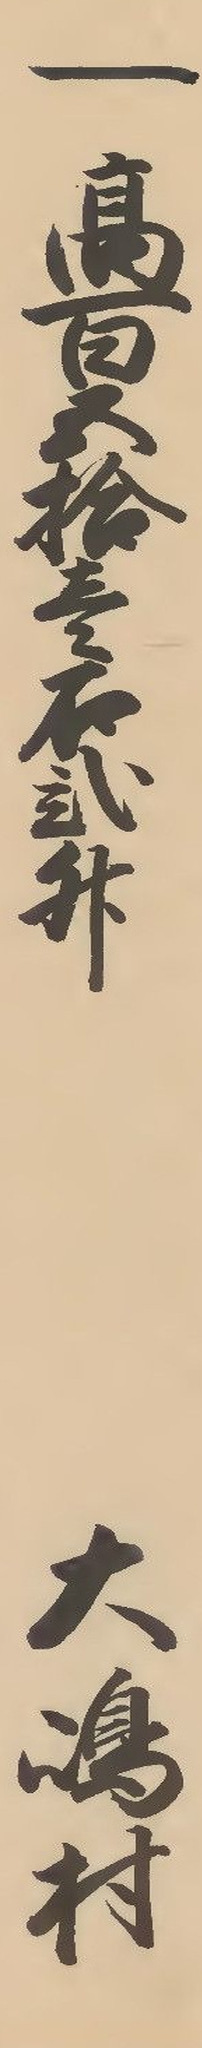一高百五拾壱石弐升大島村
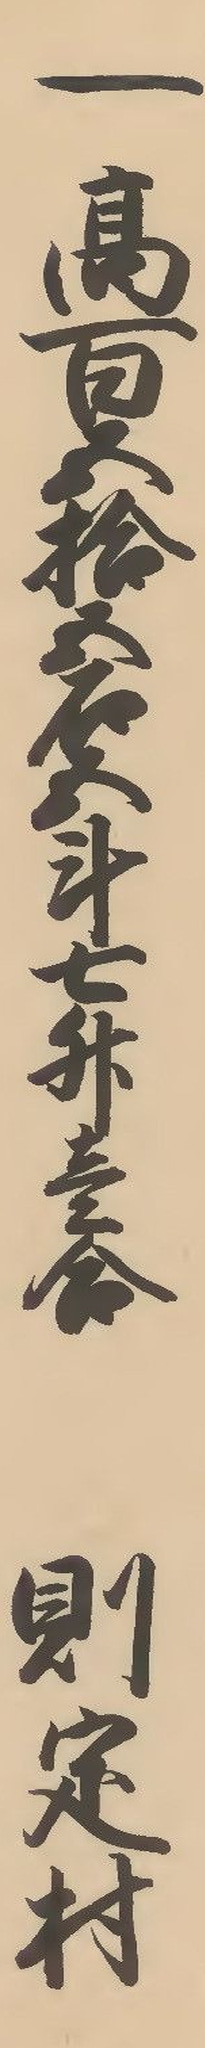一高百五拾五石五斗七升壱合則定村
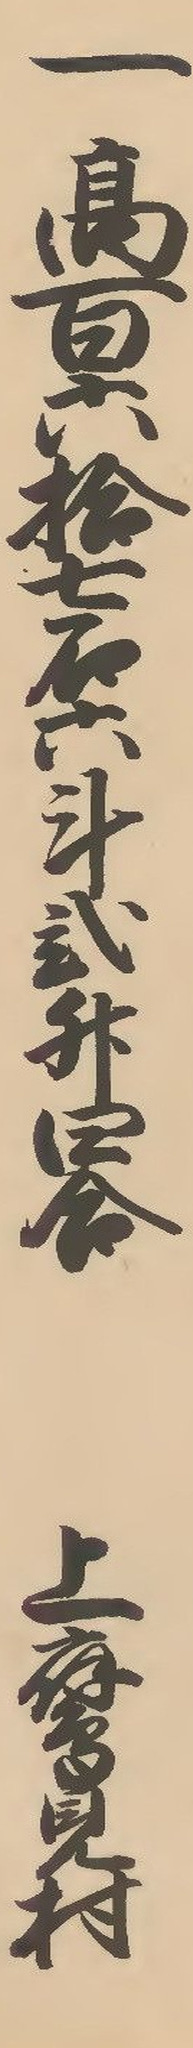一高百六拾七石六斗弐升四合上鷹見村
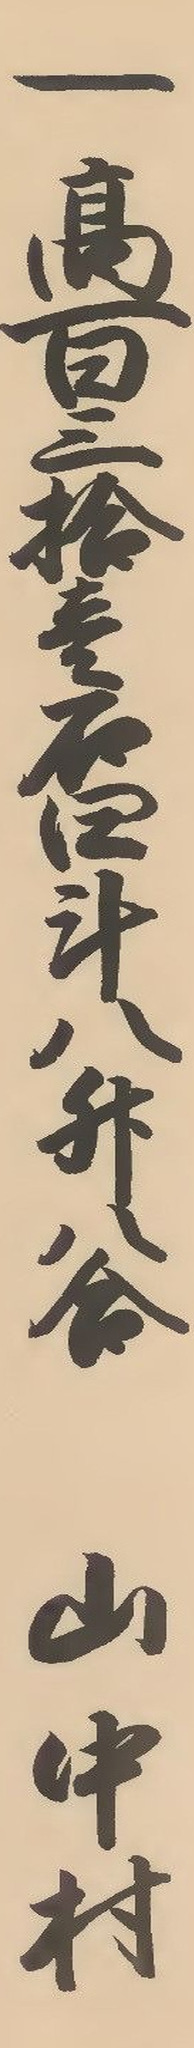一高百三拾壱石四斗八升八合山中村
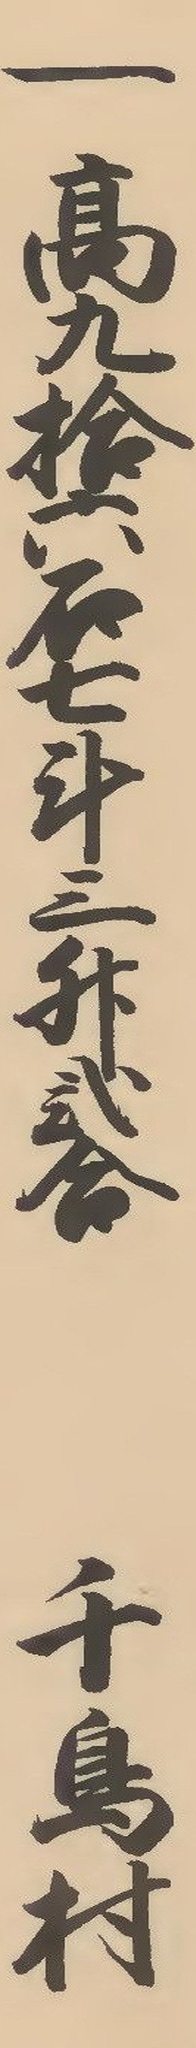一高九拾六石七斗三升弐合千鳥村
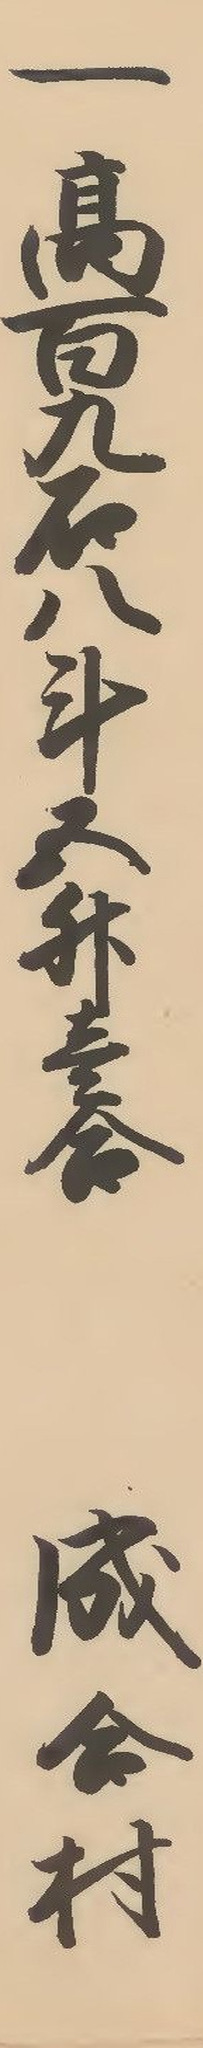一高百九石八斗五升壱合成合村
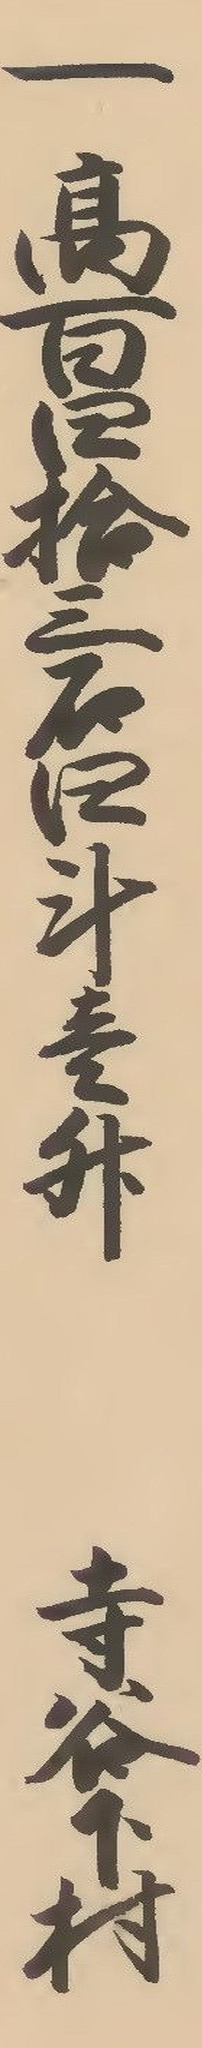一高百四拾三石四斗壱升寺谷下村
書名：三河国郷帳
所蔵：国立公文書館 National Archives of Japan
